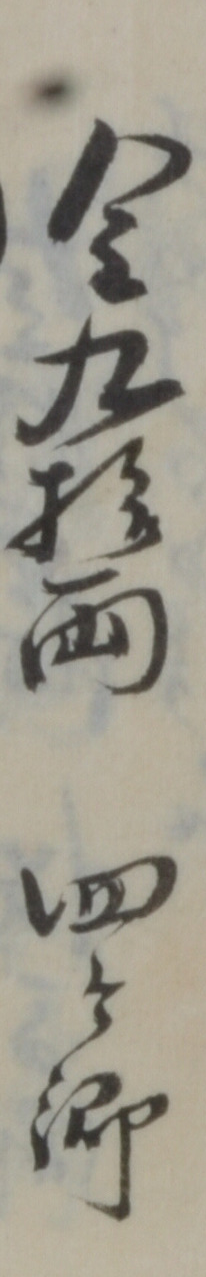一金九拾両三ヶ郷

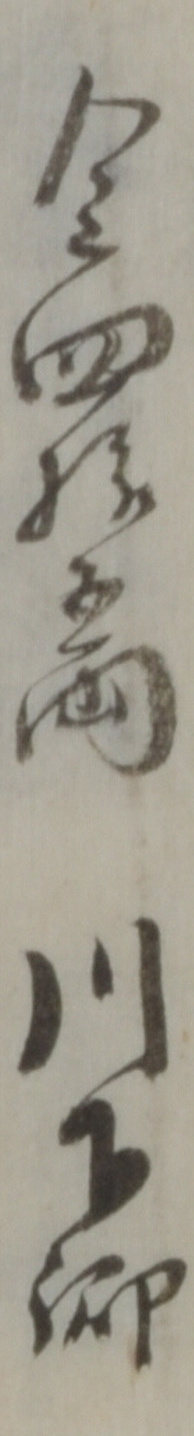金四拾五両上伊那郷
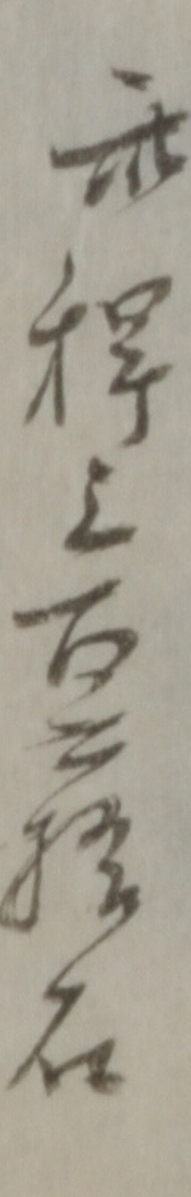此稈三百六拾石
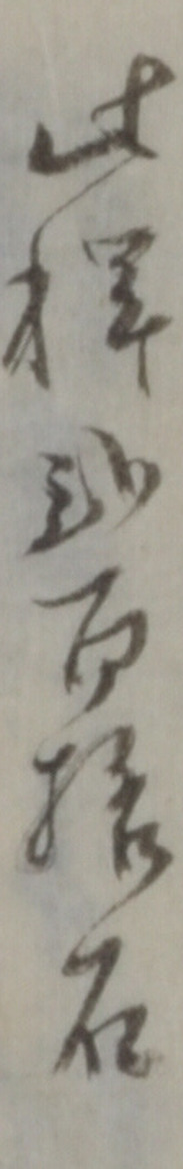此稈弐百拾五石
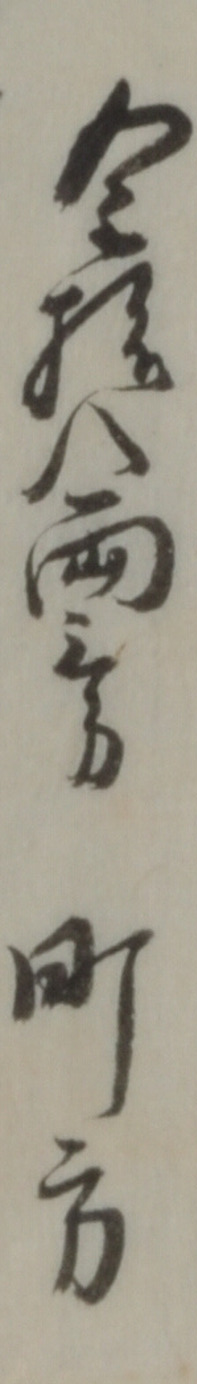金拾八両三分町方
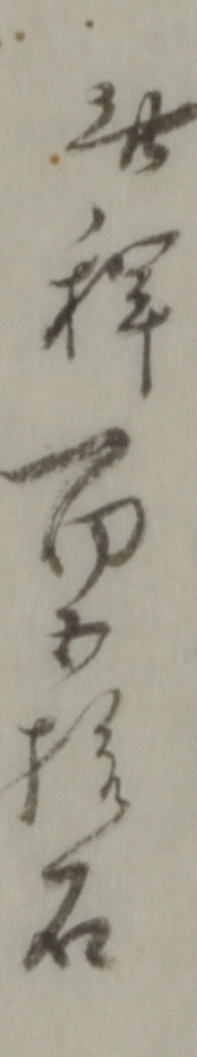此稈百五拾石
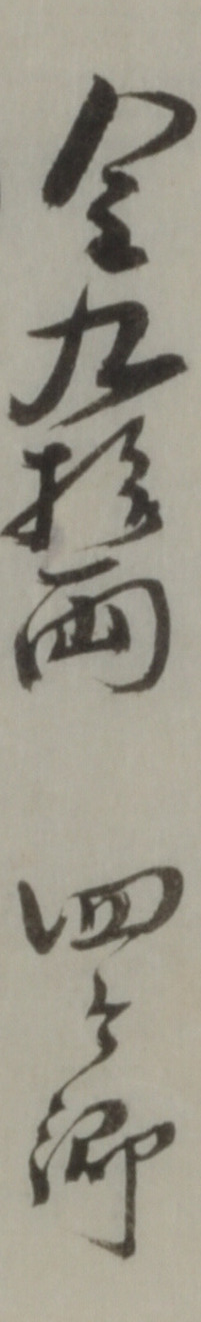一金九拾両四ヶ郷
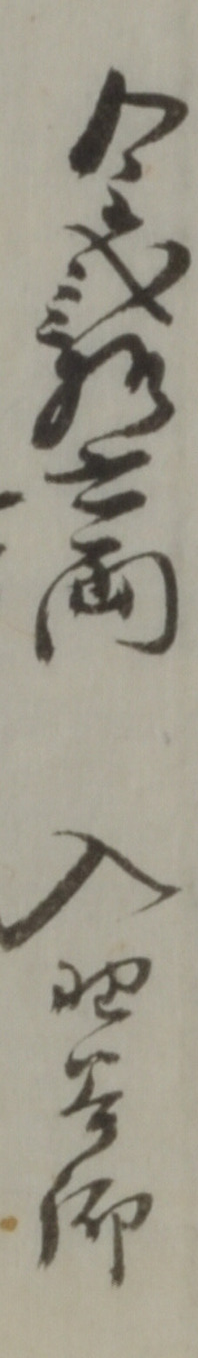金弐拾六両入野谷郷
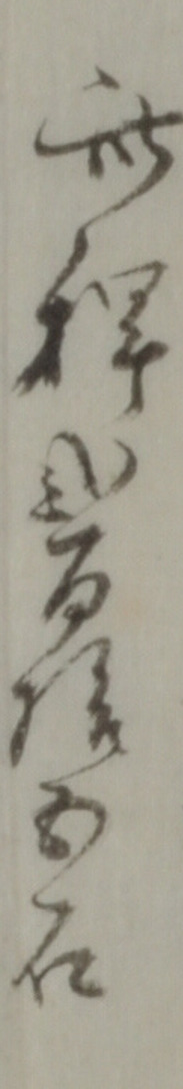此稈弐百拾五石
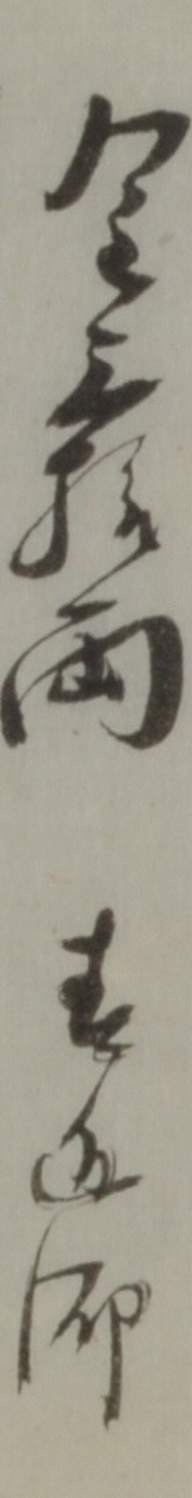金三拾両春近郷
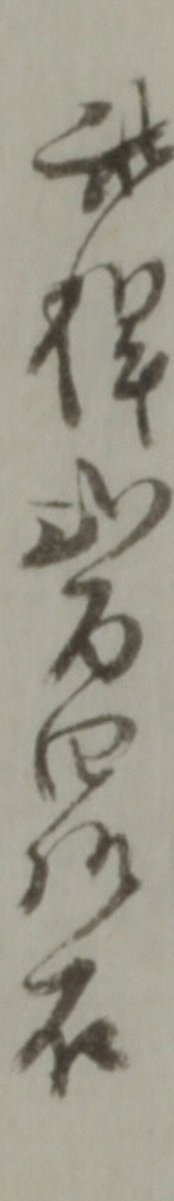此稈弐百四拾石
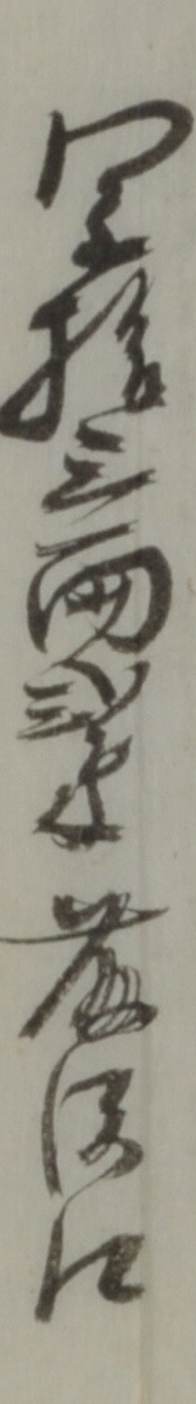金拾三両弐朱藤沢郷
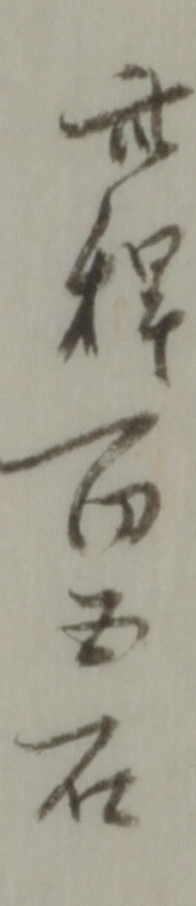此稈百五石
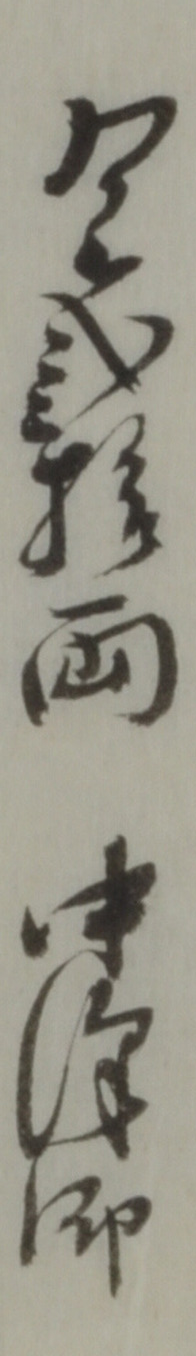金弐拾両中沢郷
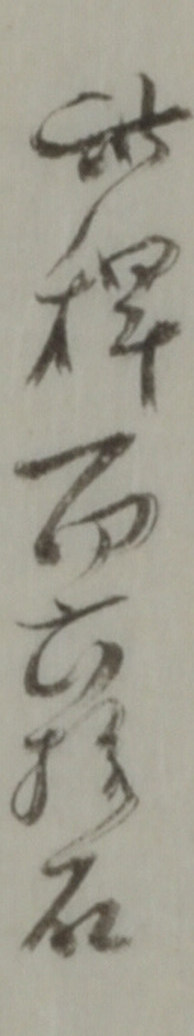此稈百六拾石
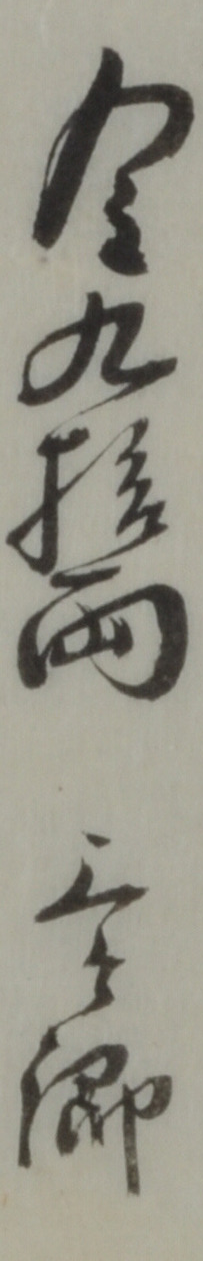一金九拾両三ヶ郷
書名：在町雑穀御買入大図
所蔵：伊那市立高遠町図書館・合同会社AMANE
